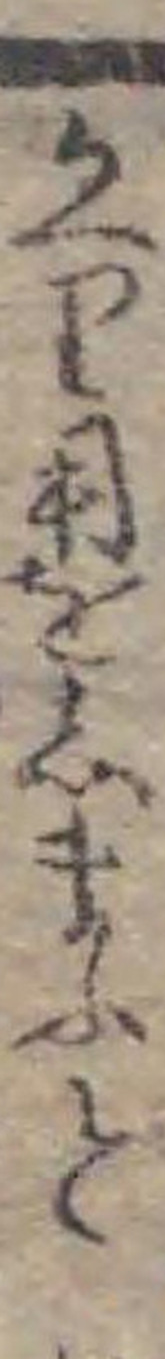かへり用をしまふと
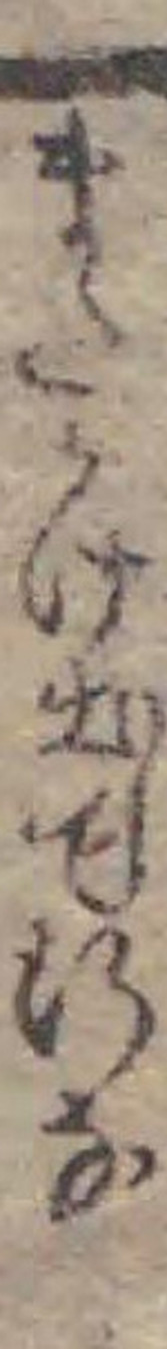またかけ出して行な
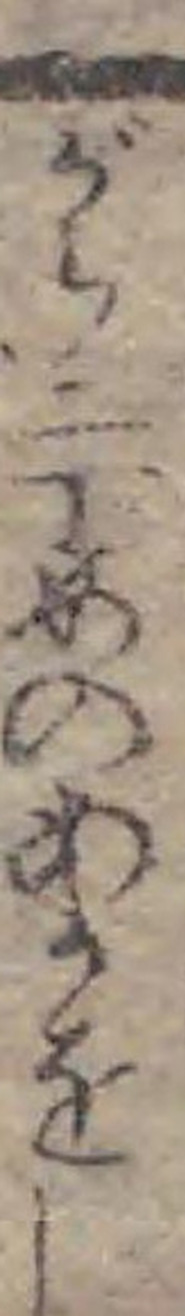がら三丁めのあかを
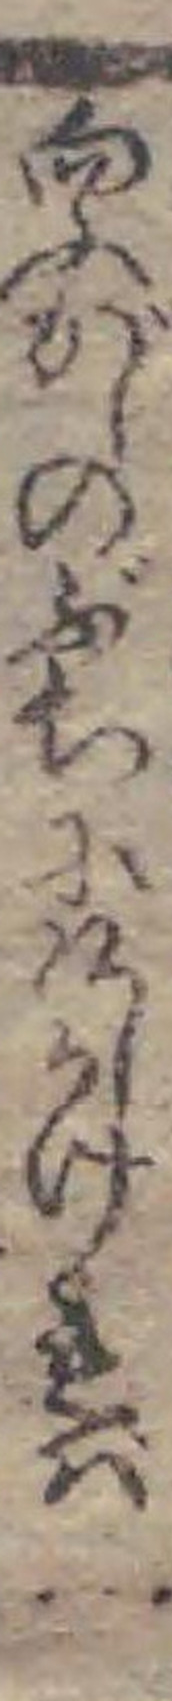向ふがしのぶちにけしかければ
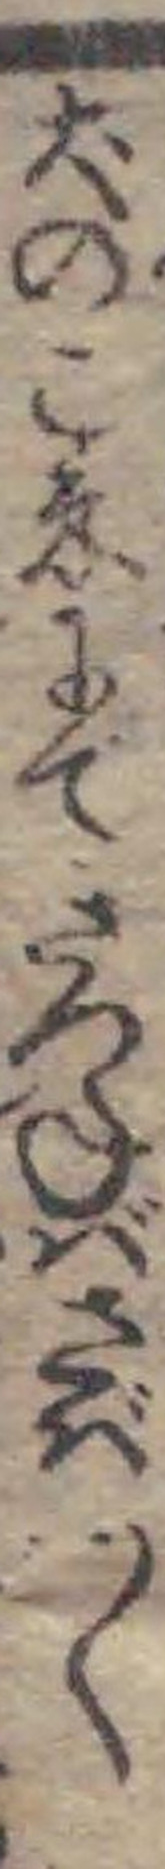犬のこゑにてきつねばさば〳〵
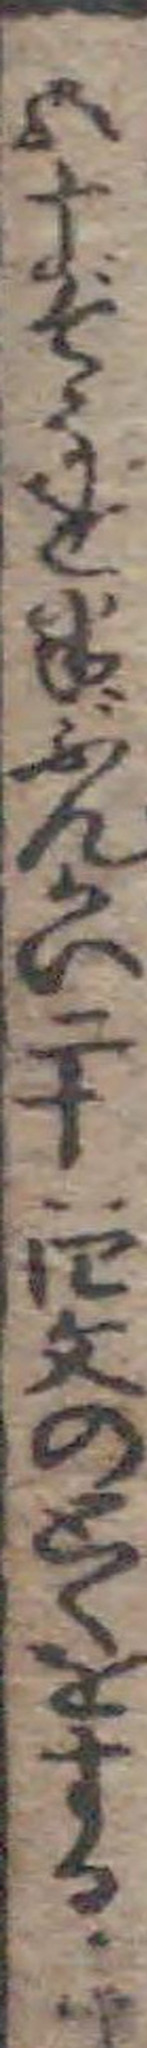五十ぞうを半ぶんかい二十四文のとくをする
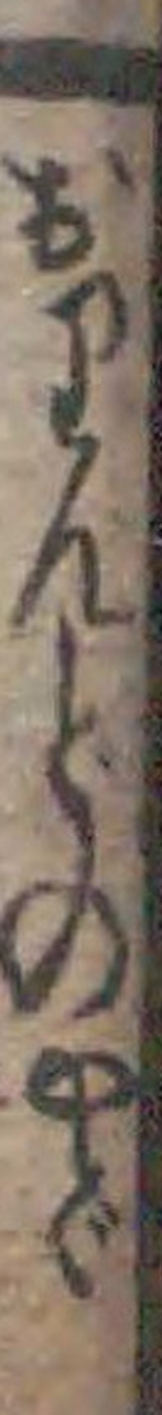おりんどのやど
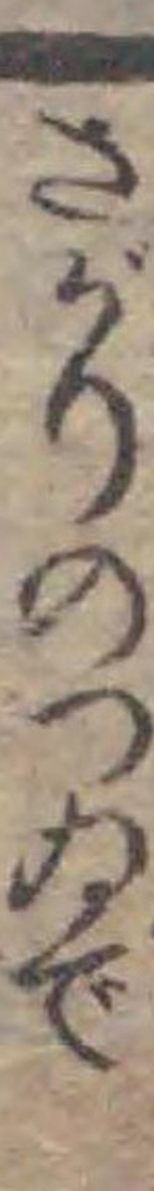さがりのつゐで
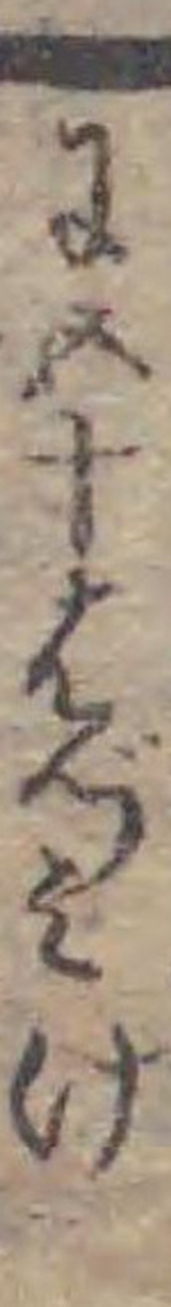に五十はづみけ
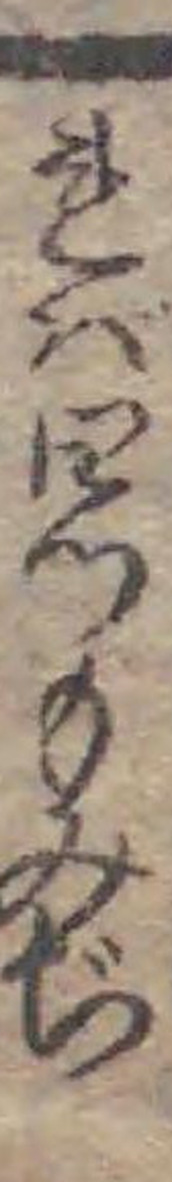れば四つもみぢ
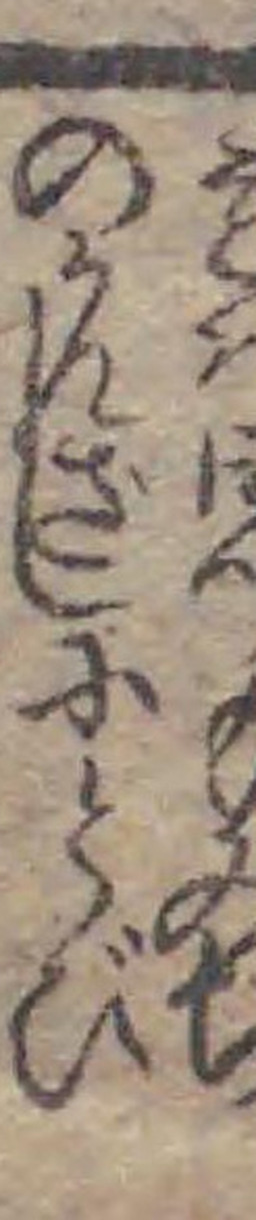のかんざしにとび
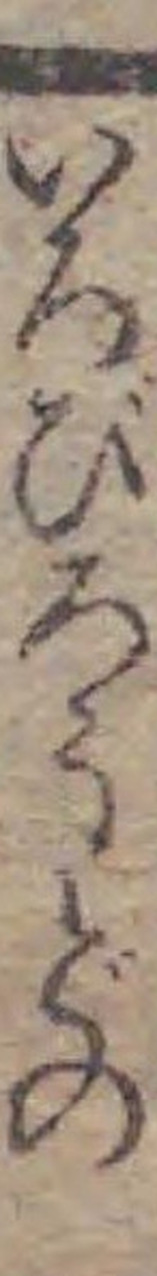いろびろうどの
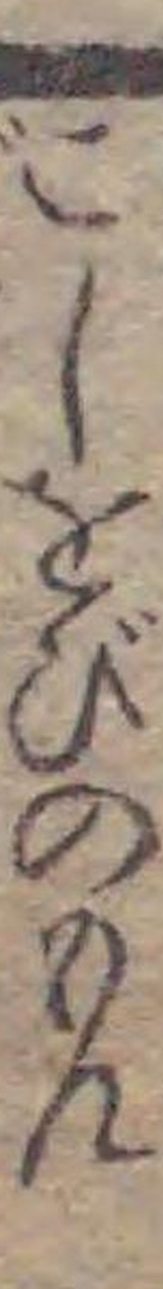こしをびのもん
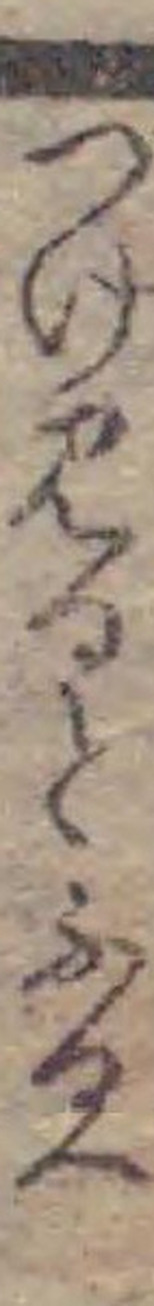づけ見るとふるへ
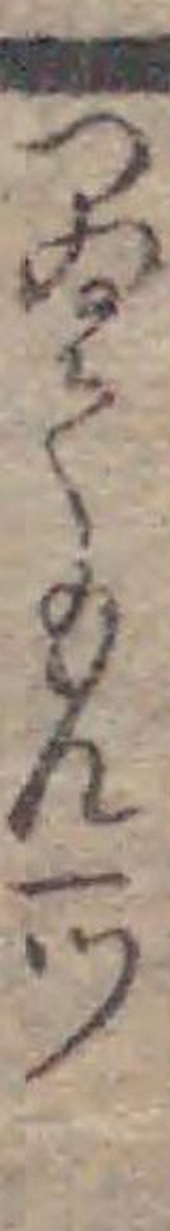つゑてもん一つ
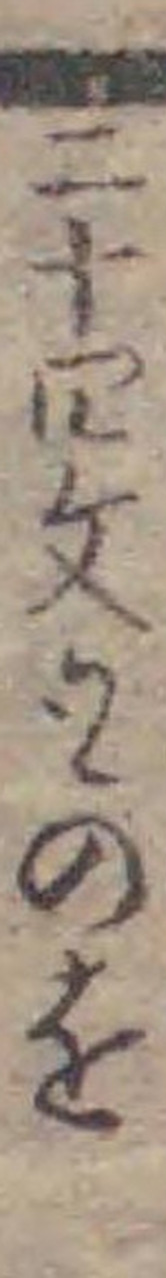二十四文つゝのを
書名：紺屋百物語 : 3巻
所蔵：国立国会図書館 National Diet Library, JAPAN
